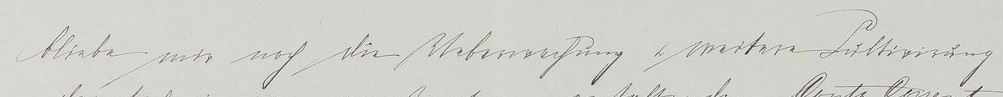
bliebe mir noch die Ueberwachung & weitere Cultivirung
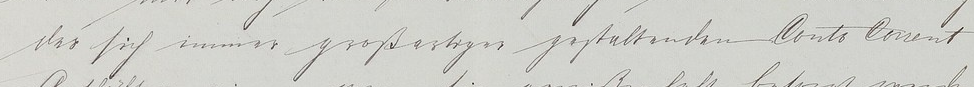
des sich immer großartiger gestaltenden Conto Corrent
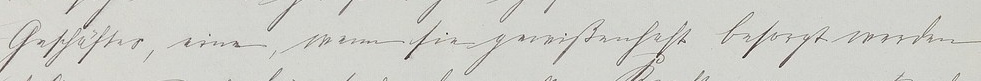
Geschäftes, eine, wenn sie gewißenhaft besorgt werden
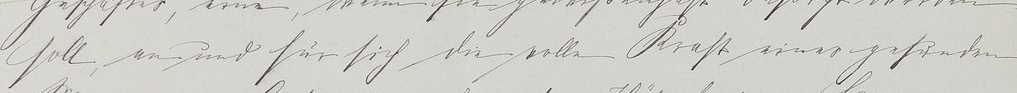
soll, an und für sich die volle Kraft eines gesunden
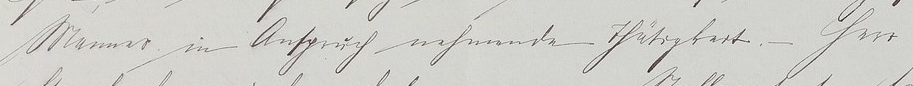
Mannes in Anspruch nehmende Thätigkeit. – Herr
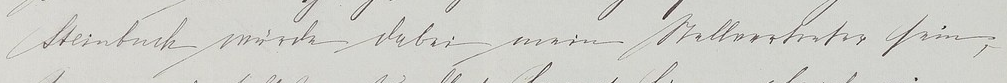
Steinbuck würde dabei mein Stellvertreter sein,
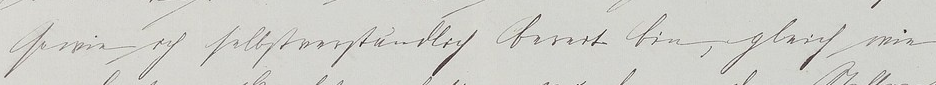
sowie ich selbstverständlich bereit bin, gleich wie
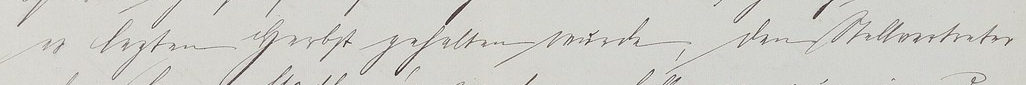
es lezten Herbst gehalten wurde, den Stellvertreter
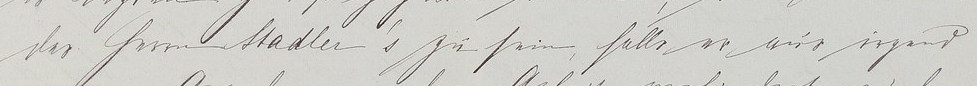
des Herrn Stadler's zu sein, falls er aus irgend
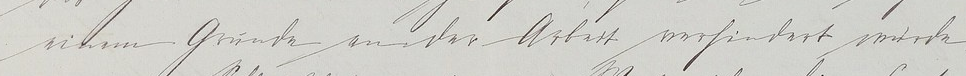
einem Grunde an der Arbeit verhindert würde.
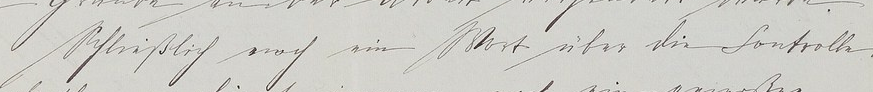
Schließlich noch ein Wort über die Controlle. –
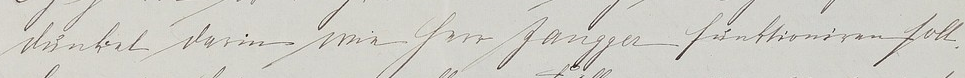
Dunkel darin wie Herr Zangger funktioniren soll.
